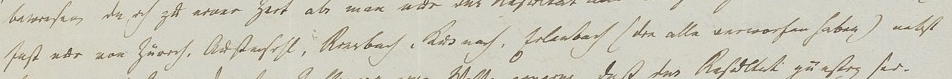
fast nur von Zürich, Außersihl, Riesbach, Küsnach, Erlenbach (die alle verworfen haben) nebst
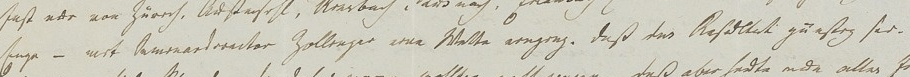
Enge – mit Seminardirector Zollinger eine Wette einging, daß das Resultat günstig sei.
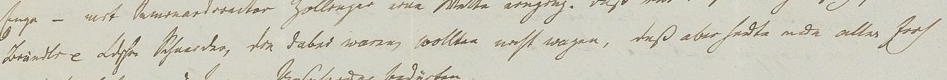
Brändli & Ldschr. Schneider, die dabei waren, wollten nicht wagen, daß aber heute nun alles froh
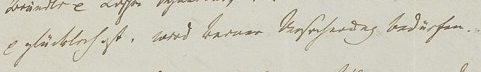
& glücklich ist, wird keiner Versicherung bedürfen.
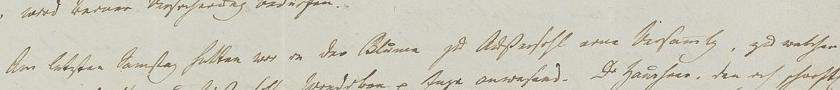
Am letzten Samstag hatten wir in der Blume zu Außersihl eine Versammlung, zu welcher
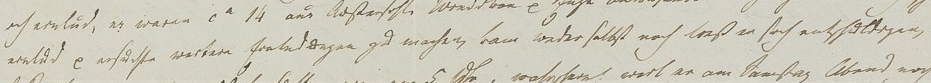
einlud & ersuchte weitere Einladungen zu machen, kam weder selbst noch ließ er sich entschuldigen.
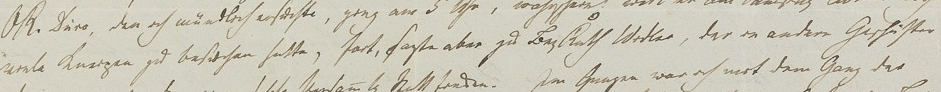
viele Kneipen zu besuchen hatte, fort, sagte aber zu BezRath Widler, der in andern Geschäften
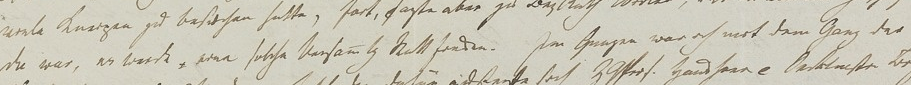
da war, es werde eine solche Versammlung Statt finden. Im Ganzen war ich mit dem Gang der
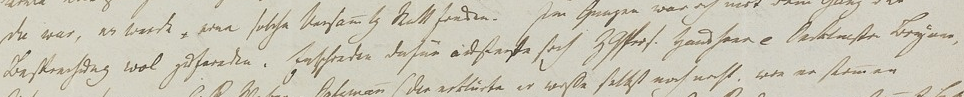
Besprechung wol zufrieden. Entschieden dafür äußerte sich ZGPräs. Hausherr & Secklmstr Bryner,
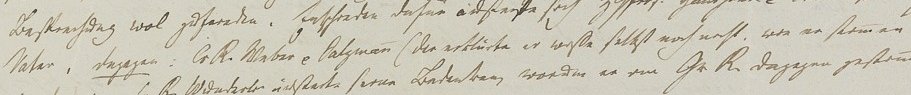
Vater, dagegen: CrR. Weber & Salzmann (der erklärte er wisse selbst noch nicht, wie er stimmen
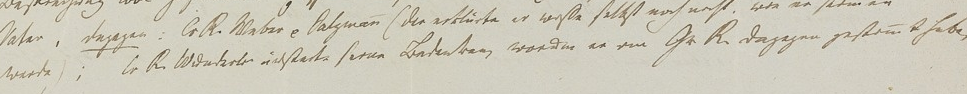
werde); CrR. Wunderli äußerte seine Bedenken, warum er im Gr. R. dagegen gestimmt habe,
